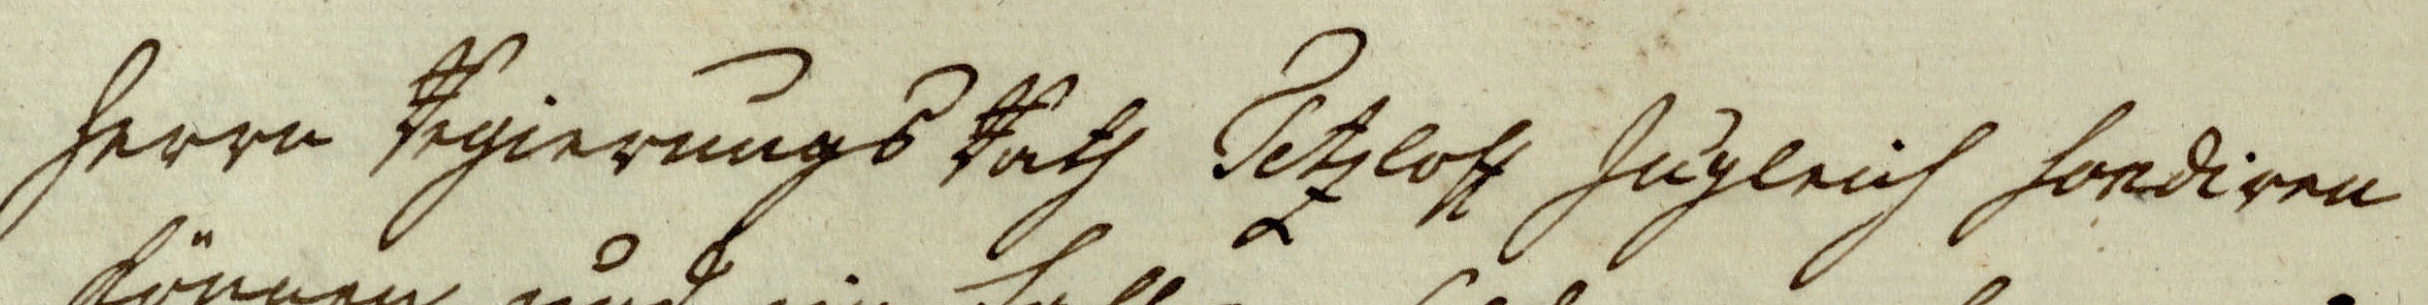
Herrn Regierungs Rath Tetzloff zugleich sondiren
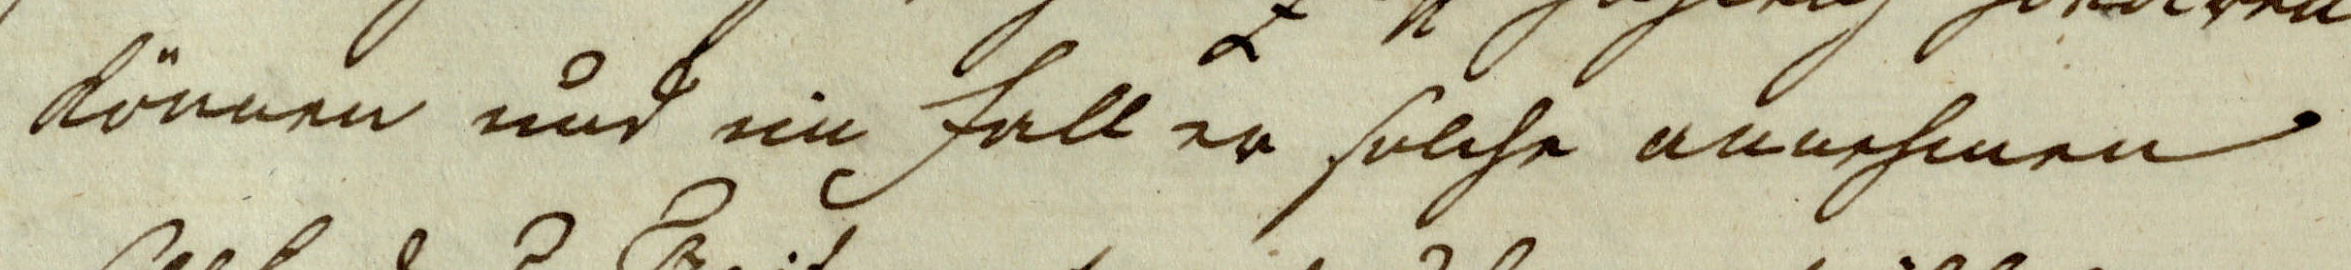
können und im Fall er solche annehmen
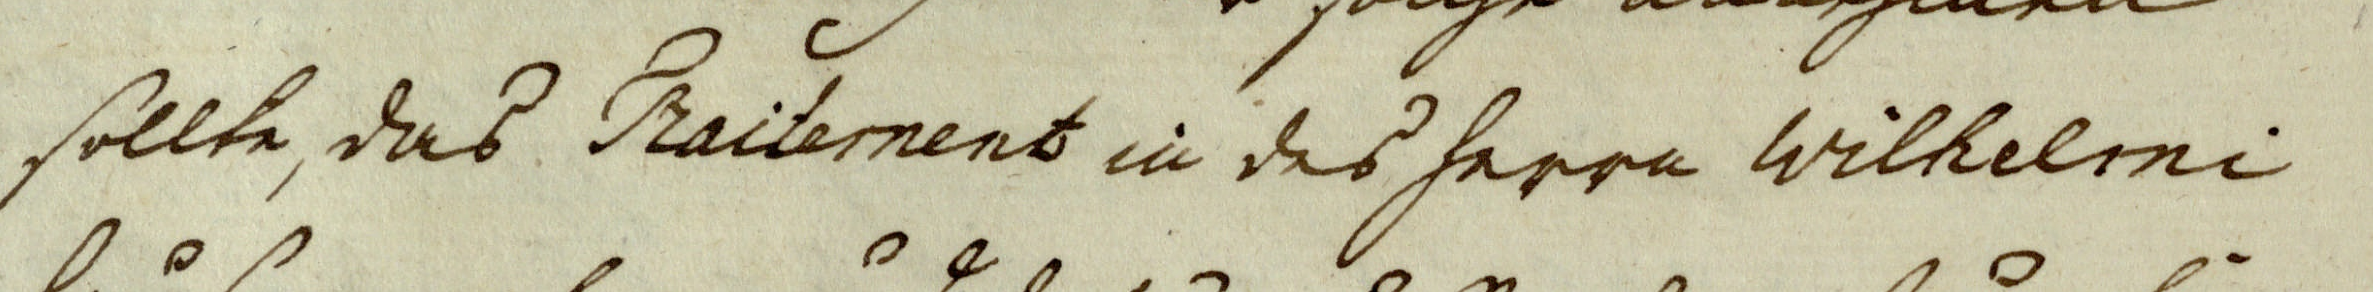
sollte, das Traitement in des Herrn Wilhelmi
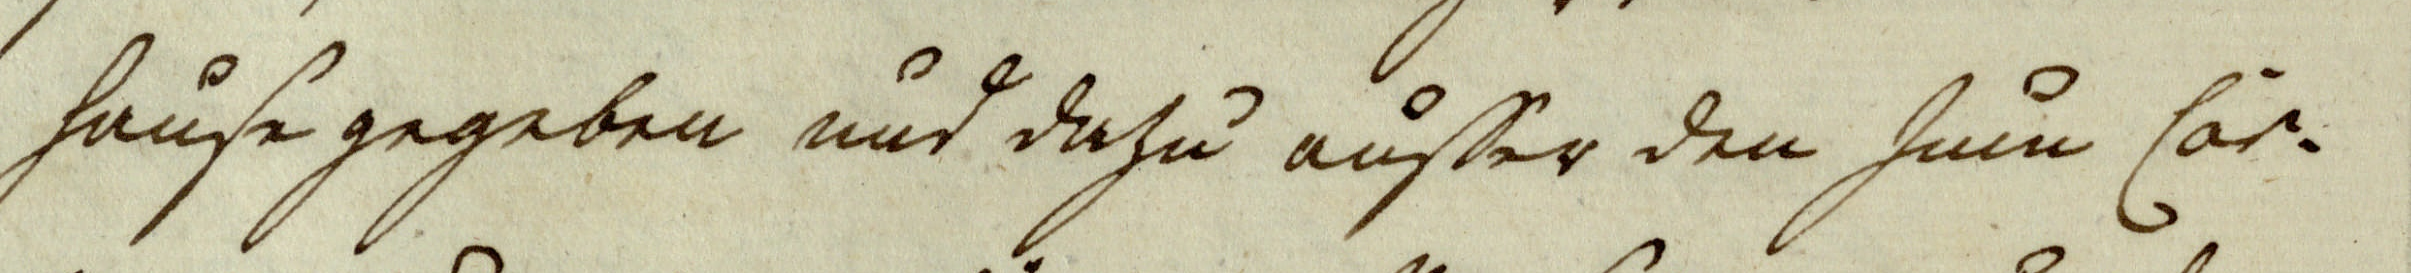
Hause gegeben und dazu ausser den zum Cor¬
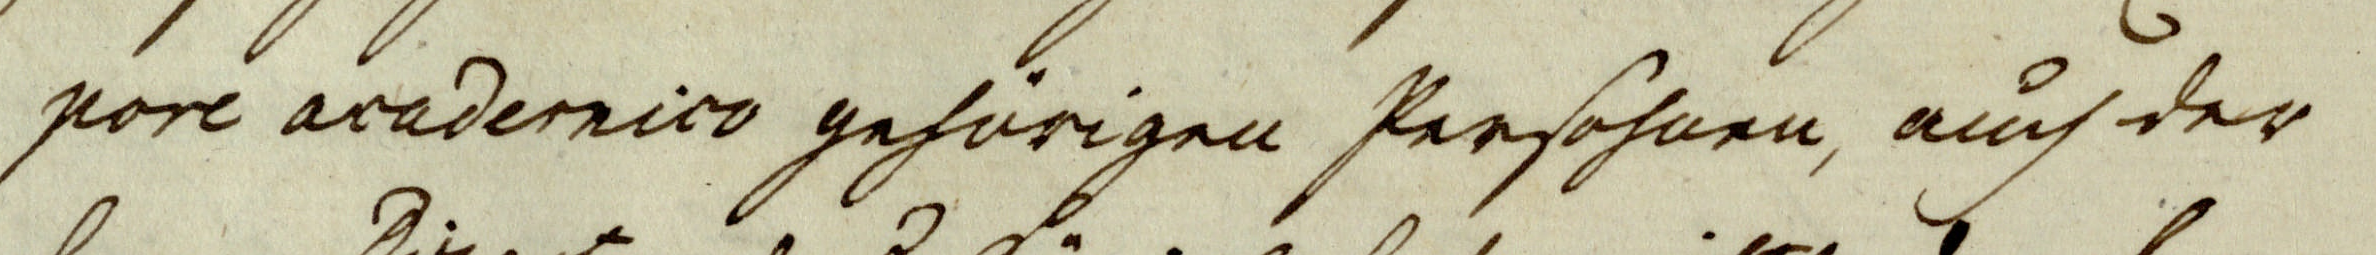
pore academico gehörigen Persohnen, auch der
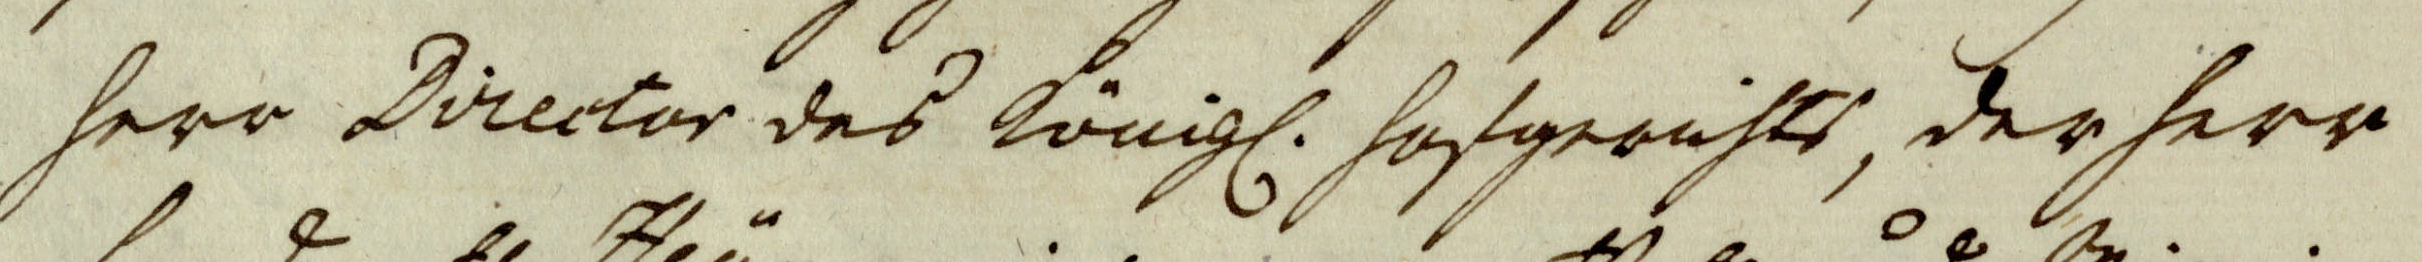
Herr Director des Königl. Hofgerichts, der Herr
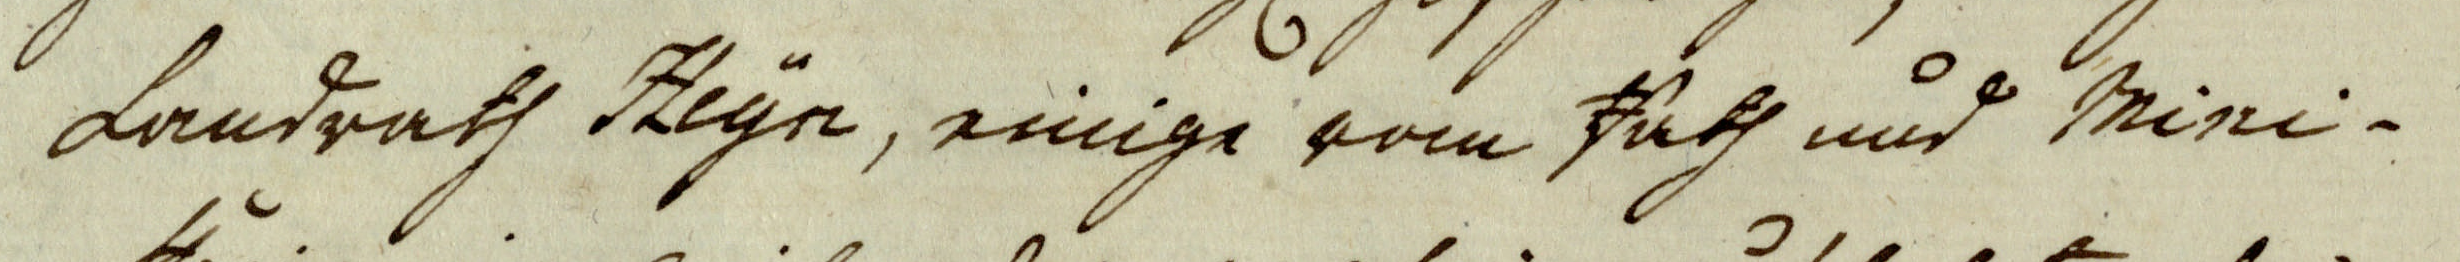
Landrath Heÿn, einige vom Rath und Mini¬
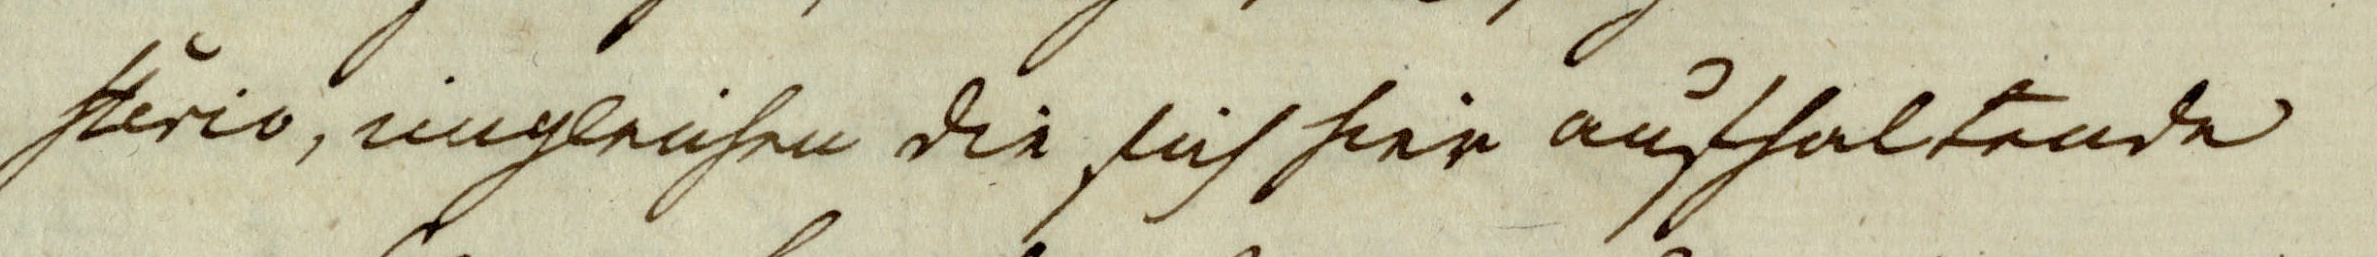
sterio, imgleichen die ich hier aufhaltende
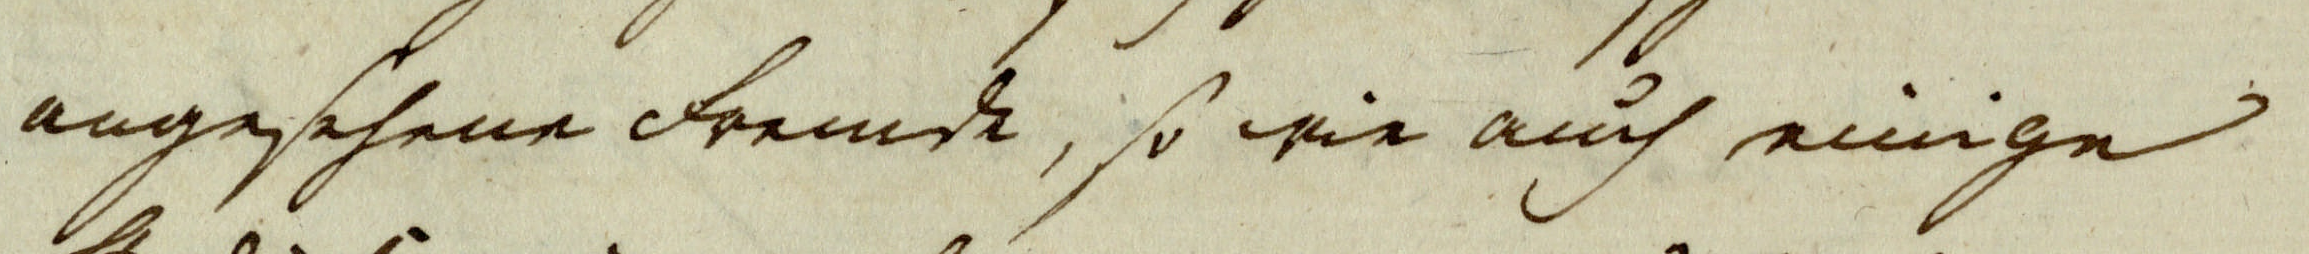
angesehene Fremde, so wie auch einige
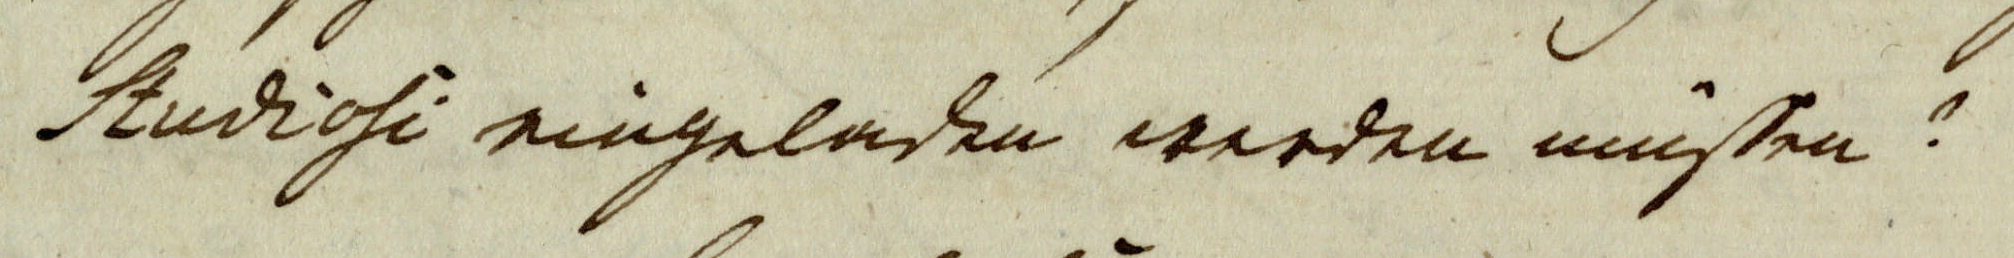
Studiosi eingeladen werden müssen?
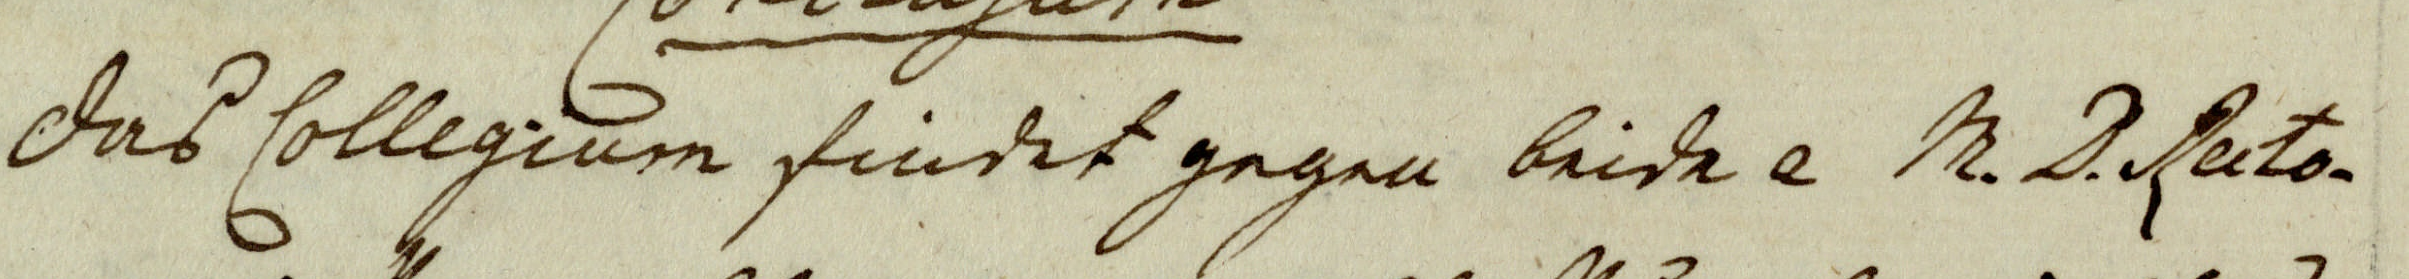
Das Collegium findet gegen beide a M. D. Recto¬
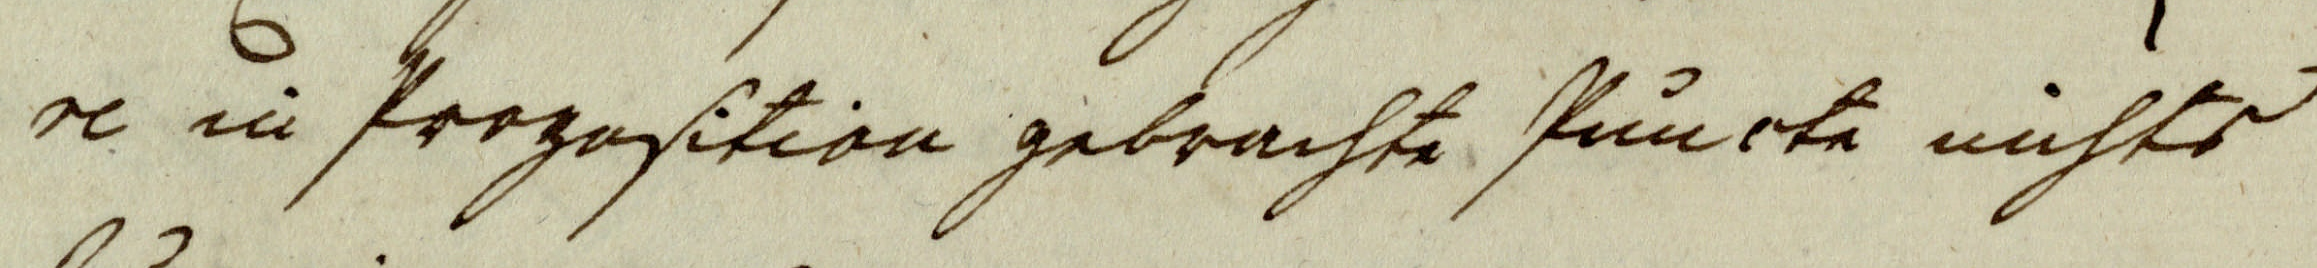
re in Proposition gebrachte Puncte nichts
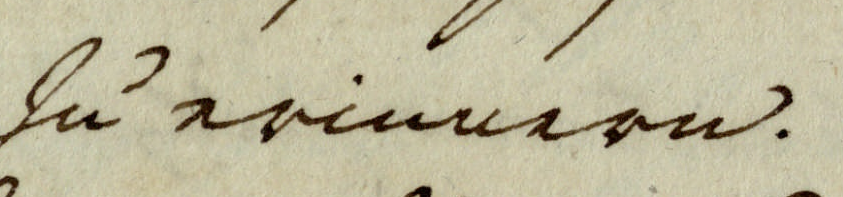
zu erinnern.
